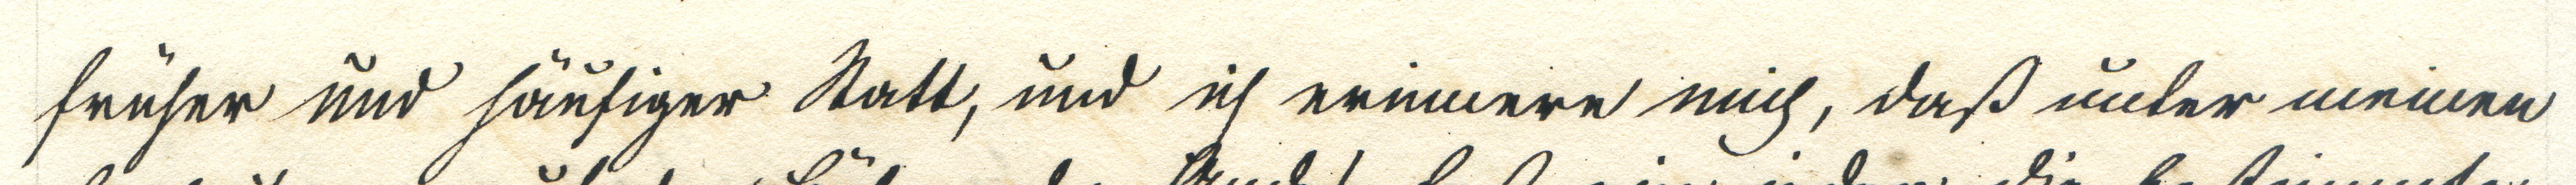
früher und häufiger Statt, und ich erinnere mich, daß unter meinen
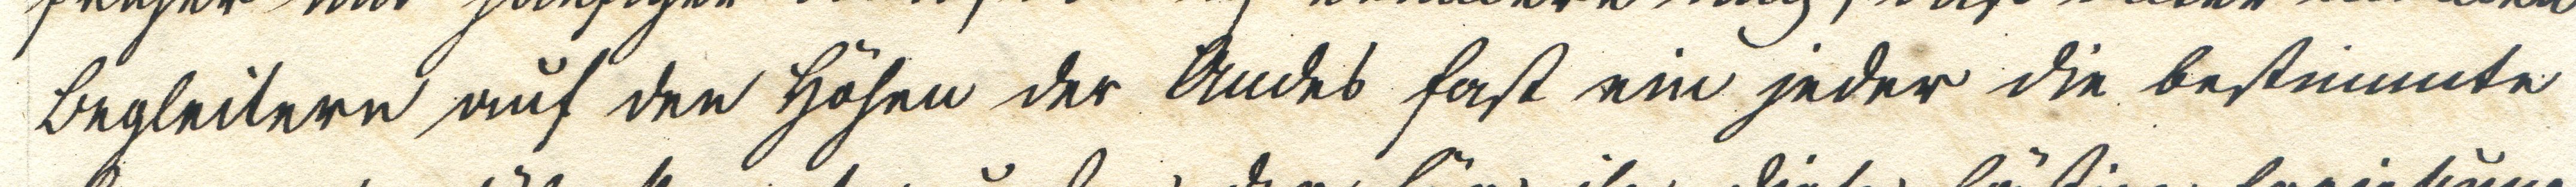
Begleitern auf den Höhen der Andes fast ein jeder die bestimmte
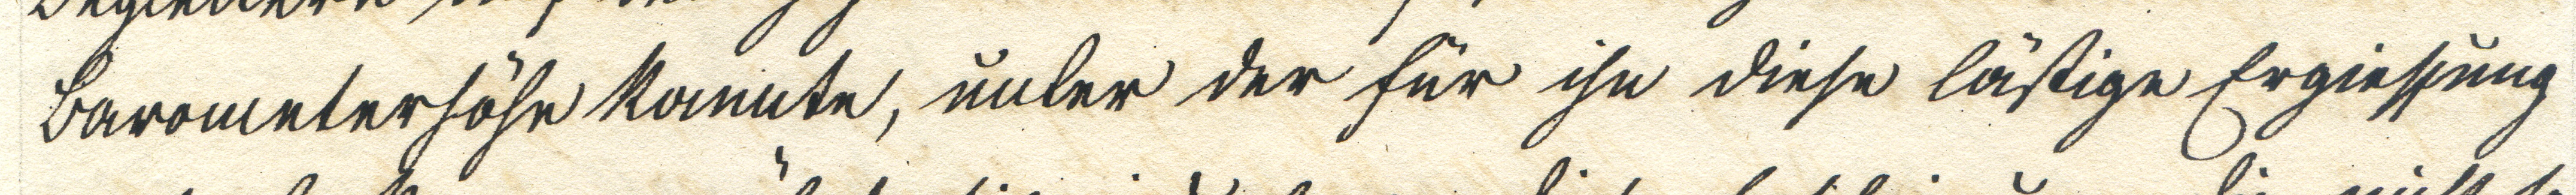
Barometerhöhe kannte, unter der für ihn diese lästige Ergiessung
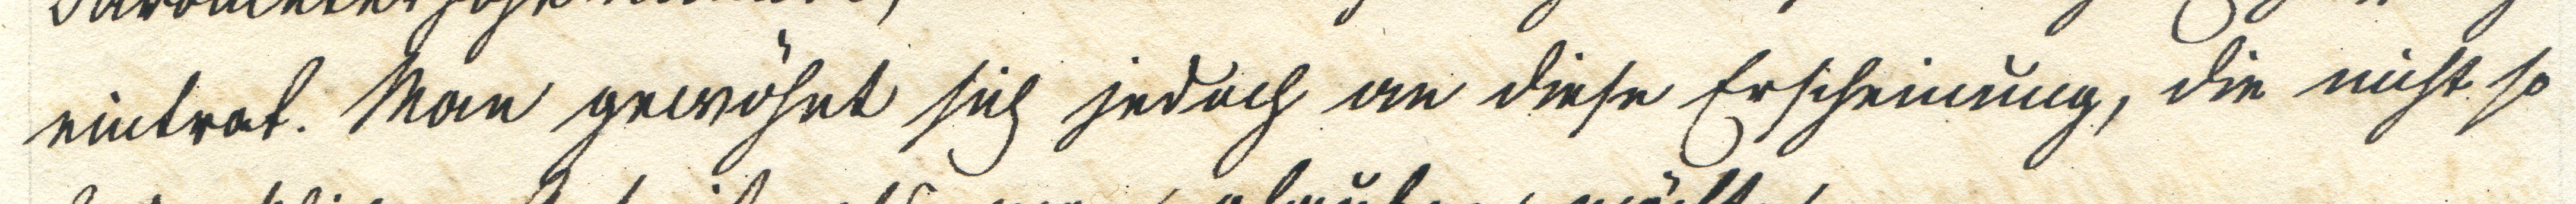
eintraf. Man gewöhnt sich jedoch an diese Erscheinung, die nicht so
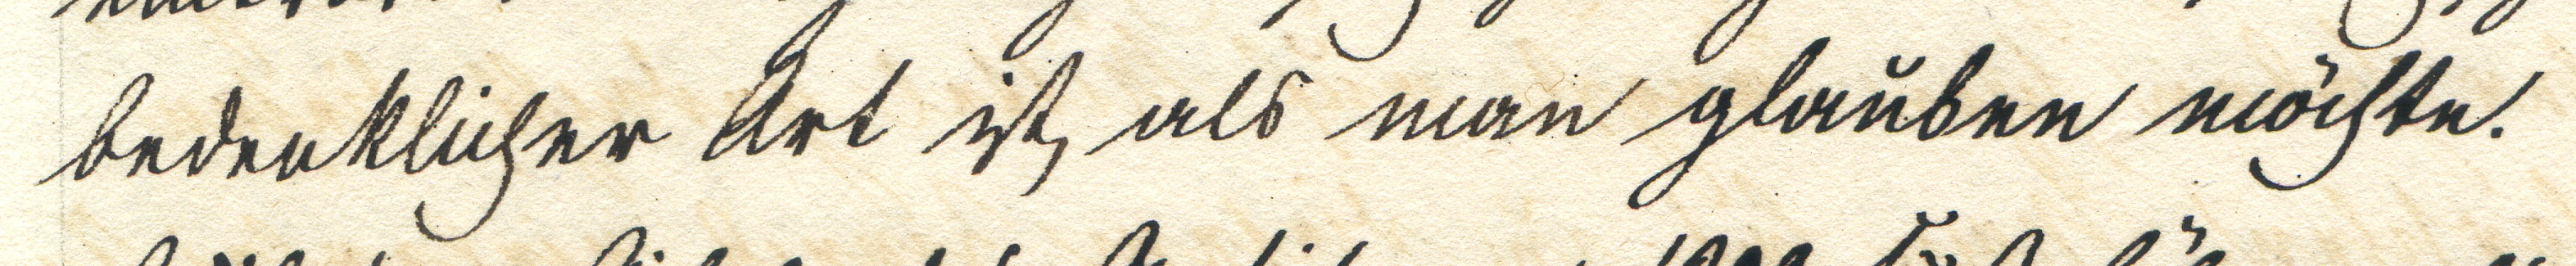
bedenklicher Art ist, als man glauben möchte.
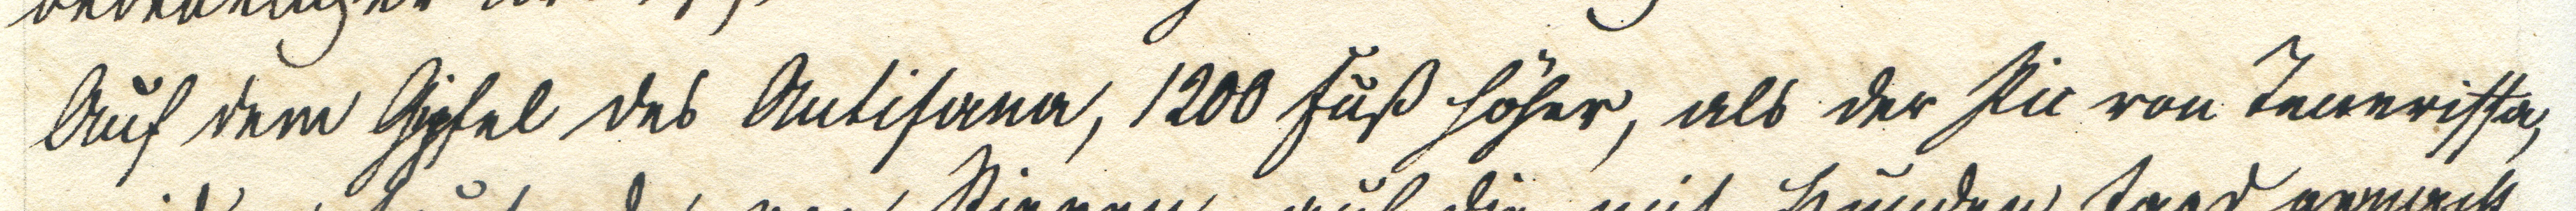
Auf dem Gipfel des Antisana, 1200 Fuß höher, als der Pic von Teneriffa,
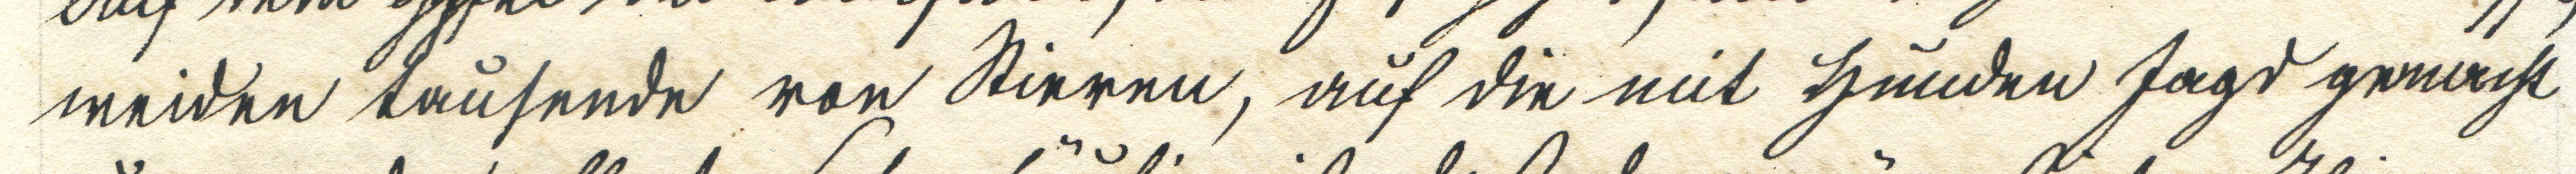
weiden tausende von Stieren, auf die mit Hunden Jagd gemacht
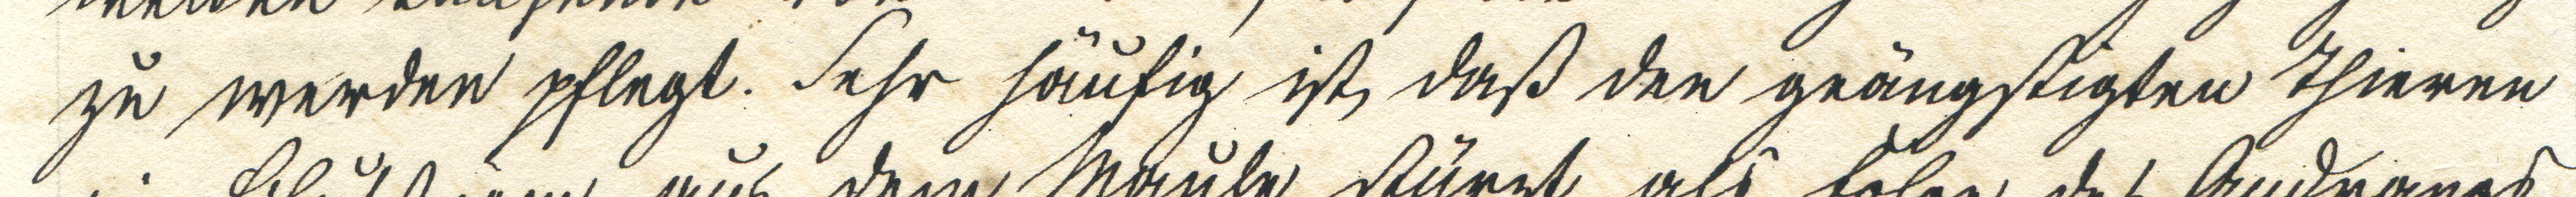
zu werden pflegt. Sehr häufig ist, daß den geängstigten Thieren
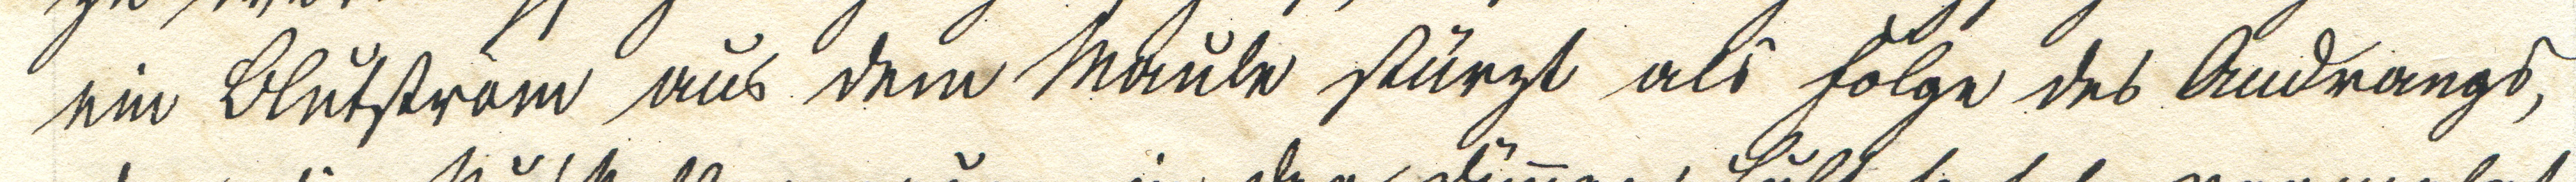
ein Blutstrom aus dem Maule stürzt als Folge des Andrangs,
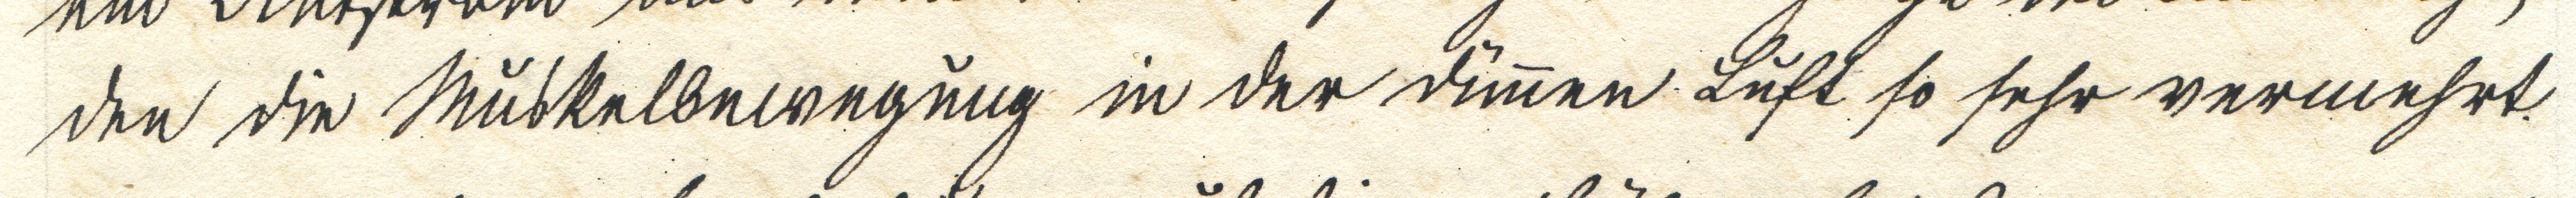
den die Muskelbewegung in der düñen Luft so sehr vermehrt.
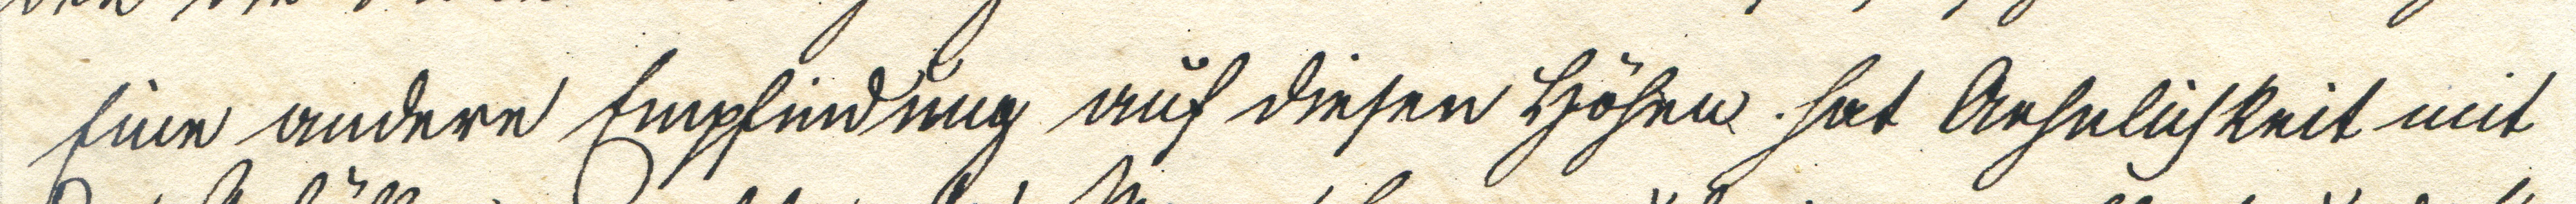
Eine andere Empfindung auf dieser Höhe hat Aehnlichkeit mit
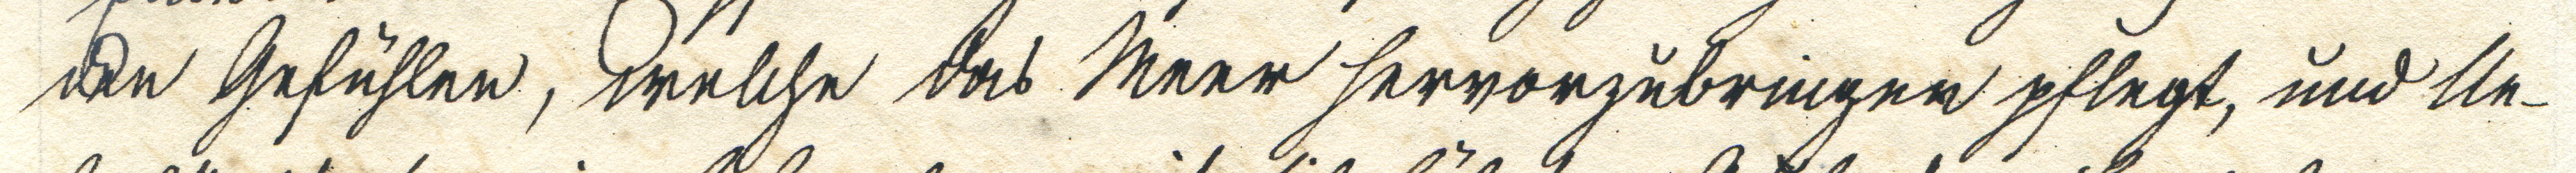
den Gefühlen, welche das Meer hervorzubringen pflegt, und Ue-
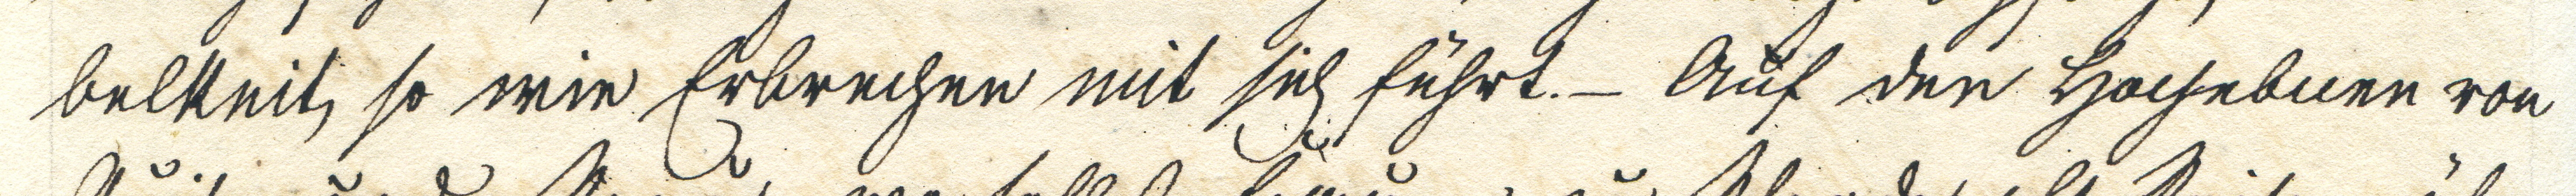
belkeit, so wie Erbrechen mit sich führt. – Auf den Hochebnen von
